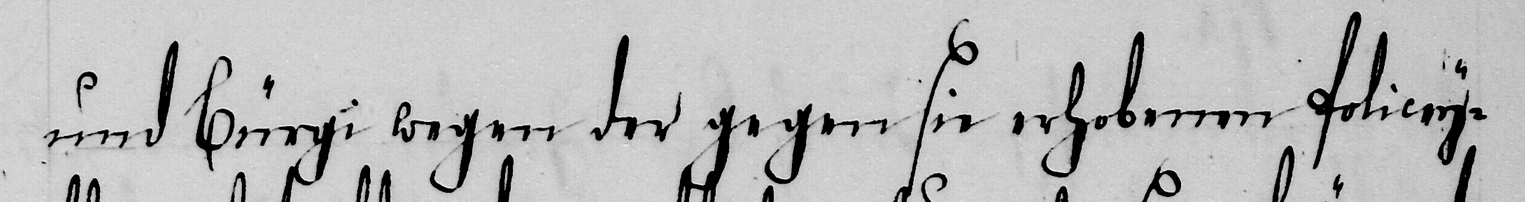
und Bürgi wegen der gegen sie erhobenen Policey¬
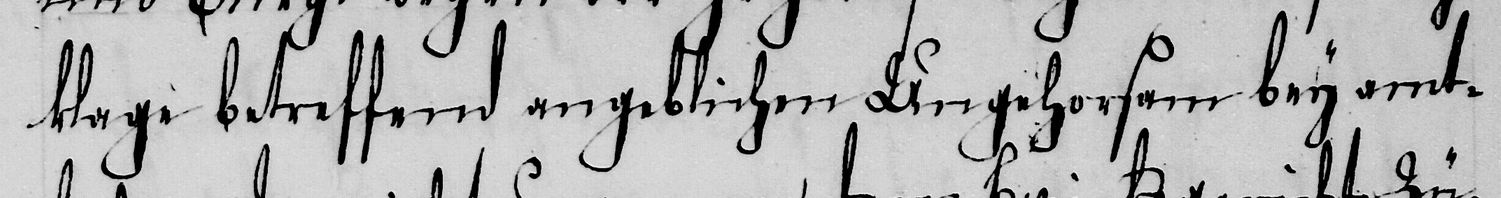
klage betreffend angeblichen Ungehorsam bey amt¬
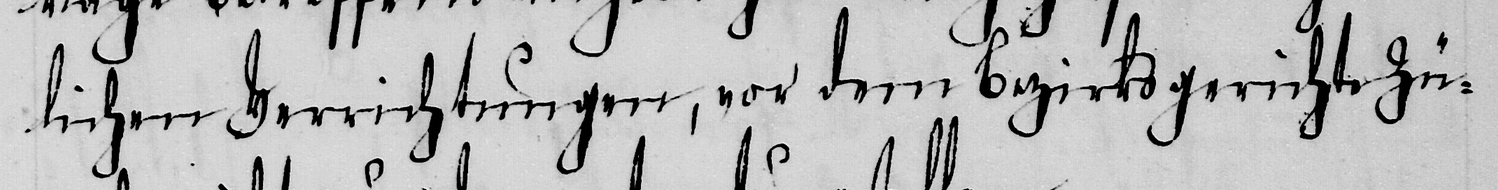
lichen Verrichtungen, vor dem Bezirksgerichte Zü¬
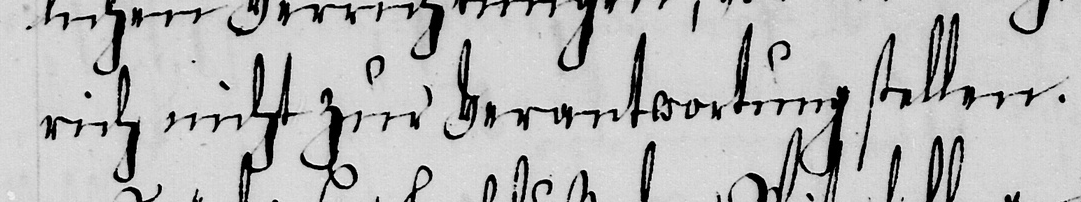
rich nicht zur Verantwortung stellen.
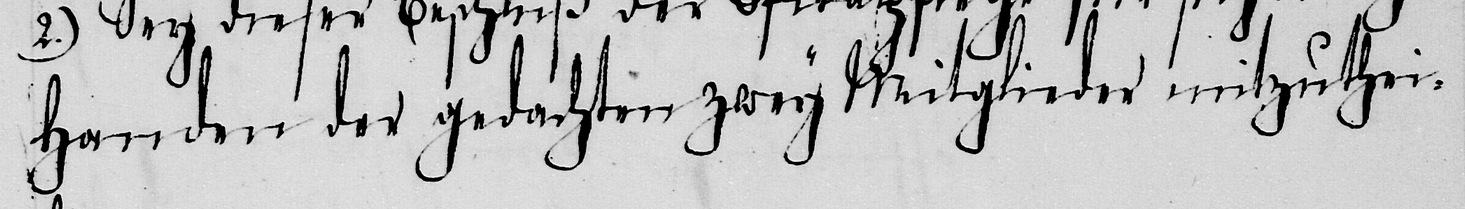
Handen der gedachten zwey Mitglieder mitzuthei¬
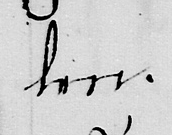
len.
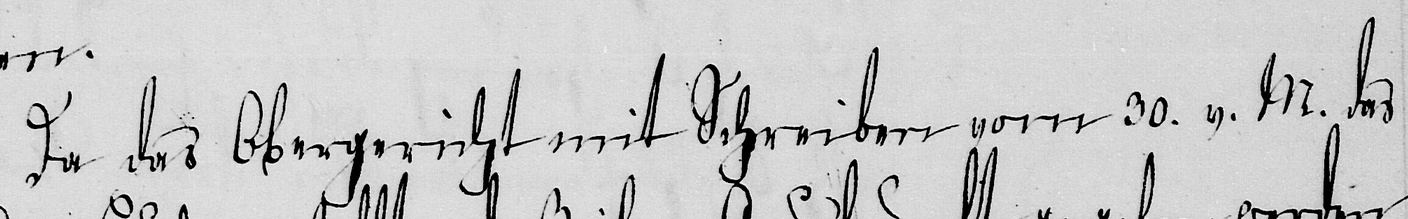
Da das Obergericht mit Schreiben vom 30. v. M. das
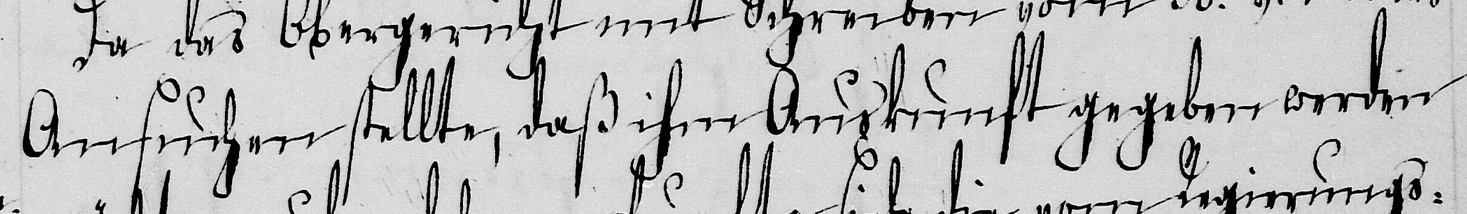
Ansuchen stellte, daß ihm Auskunft gegeben werden
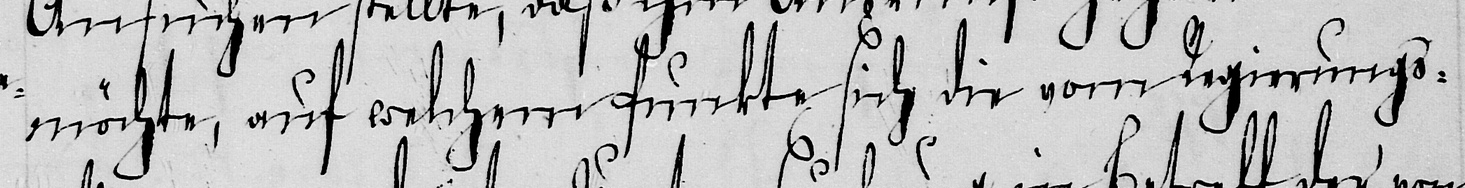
möchte, auf welchem Punkte sich die vom Regierungs¬
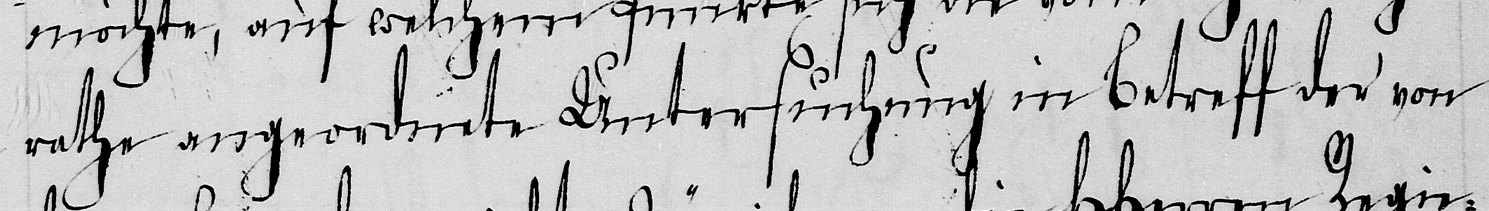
rathe angeordnete Untersuchung in Betreff der von
